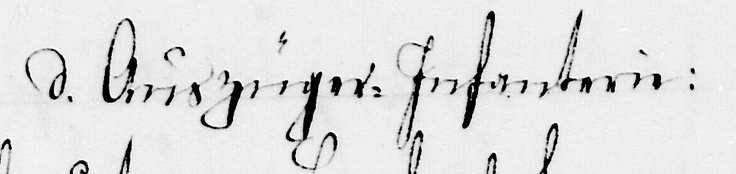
d. Auszüger-Infanterie:
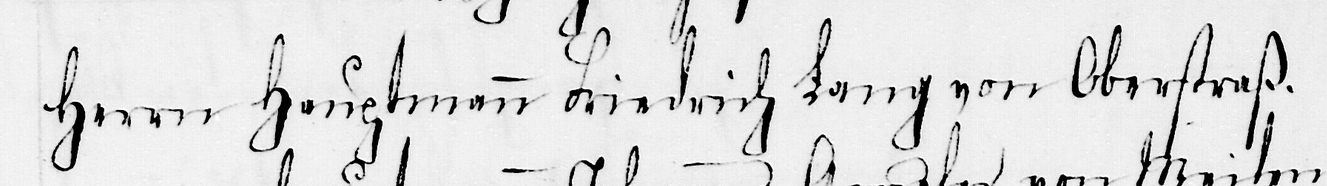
Herrn Hauptmann Friedrich Lang von Oberstraß.
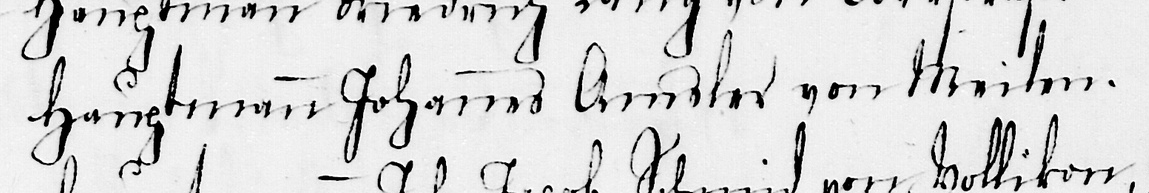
Hauptmann Johannes Amsler von Meilen.
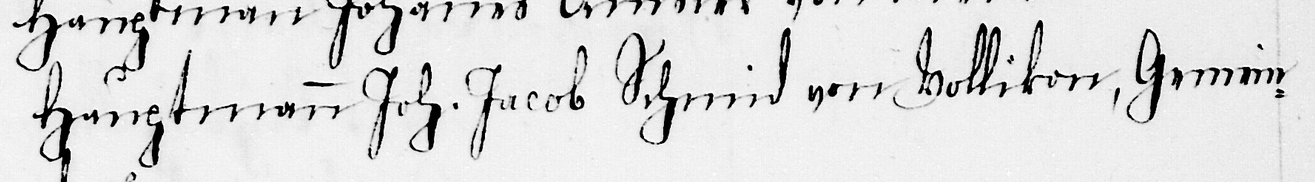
Hauptmann Joh. Jacob Schmid von Vollikon, Gemein¬
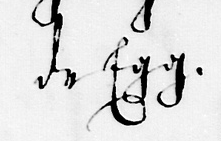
de Egg.
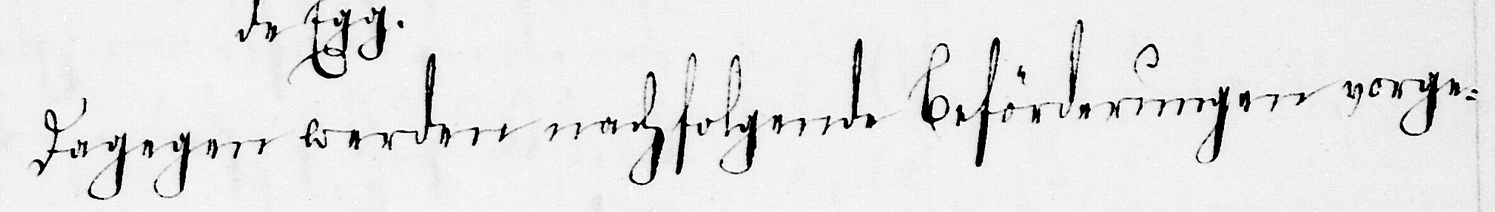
Dagegen werden nachfolgende Beförderungen vorge¬
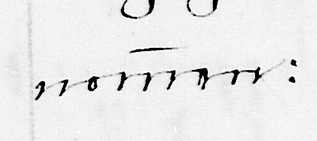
nommen:
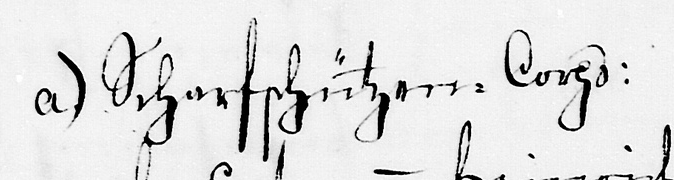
a.) Scharfschützen-Corps:
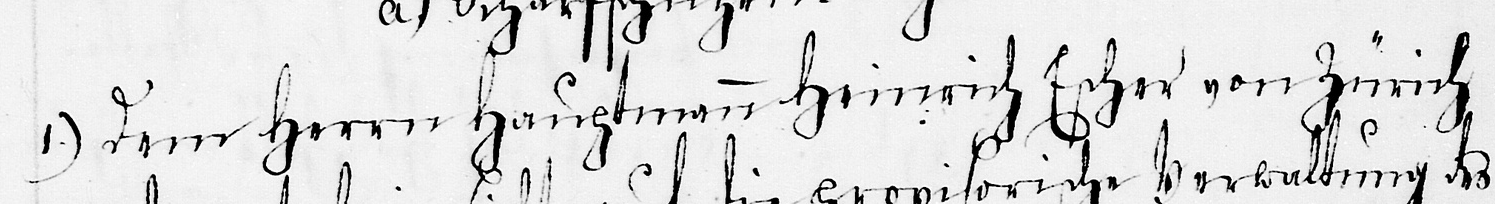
1.) Dem Herrn Hauptmann Heinrich Escher von Zürich
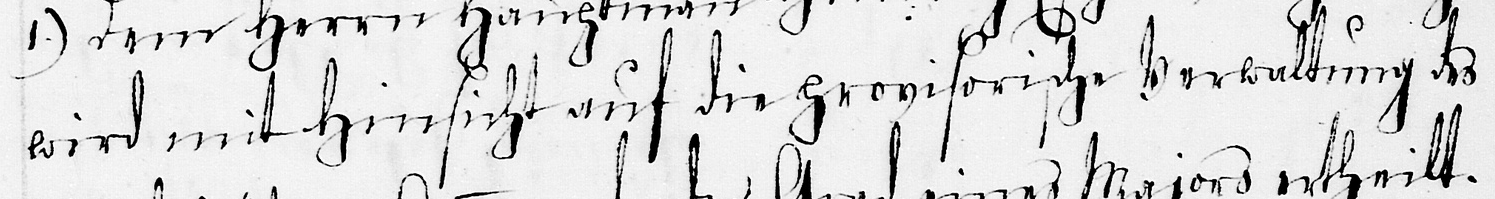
wird mit Hinsicht auf die provisorische Verwaltung des
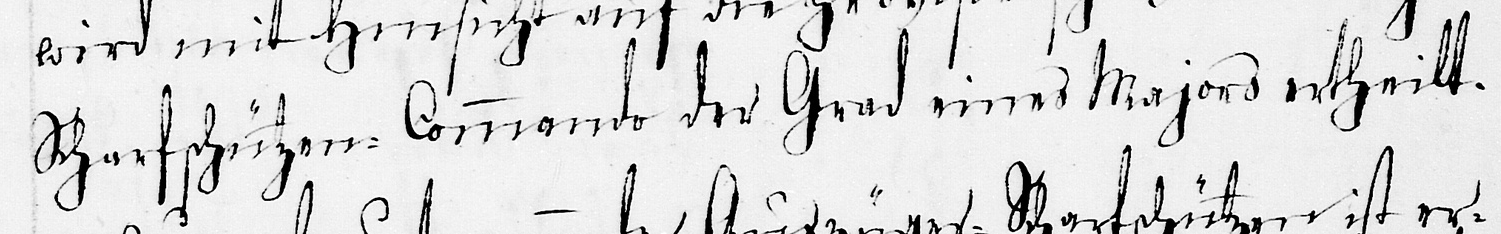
Scharfschützen-Commando der Grad eines Majors ertheilt.
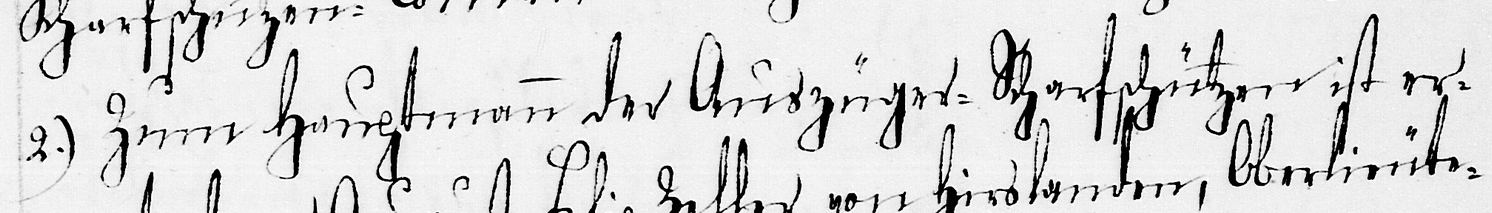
2.) Zum Hauptmann der Auszüger-Scharfschützen ist er¬
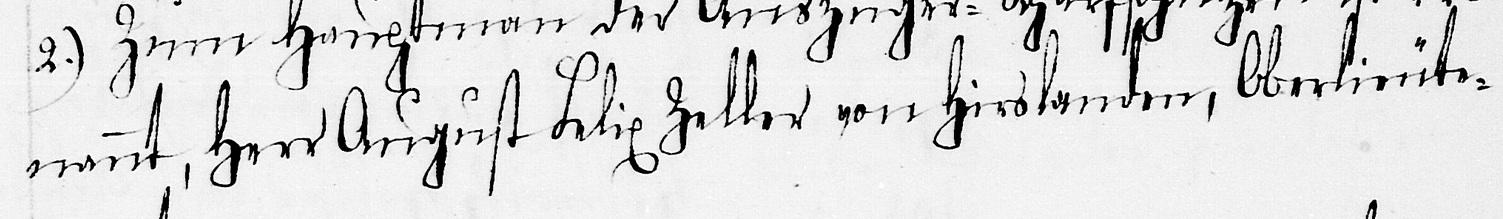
nannt, Herr August Felix Zeller von Hirslanden, Oberlieute¬
